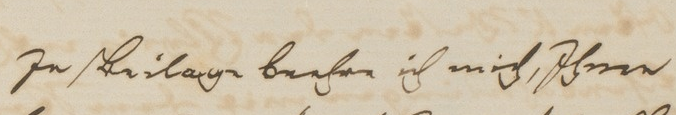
In Beilage beehre ich mich, Ihnen
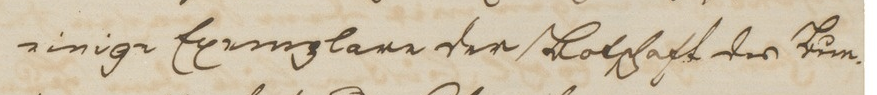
einige Exemplare der Botschaft des Bun-
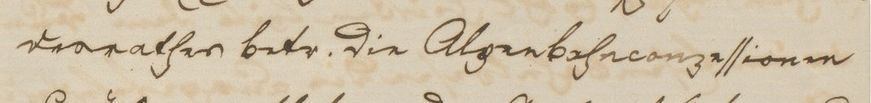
desrathes betr. die Alpenbahnconzessionen
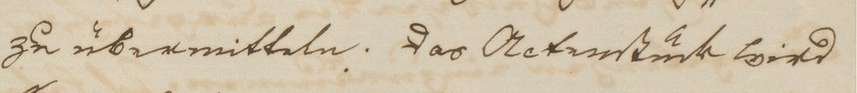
zu übermitteln. Das Actenstück wird
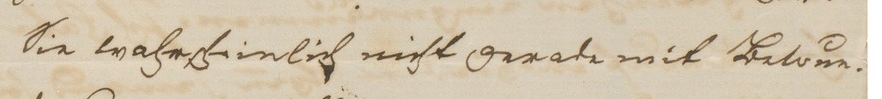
Sie wahrscheinlich nicht gerade mit Bewun-
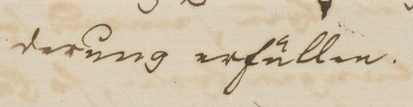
derung erfüllen.
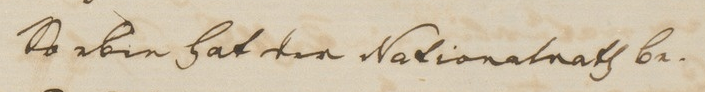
So eben hat der Nationalrath be-
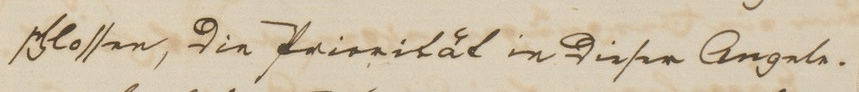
schlossen, die Priorität in dieser Angele-
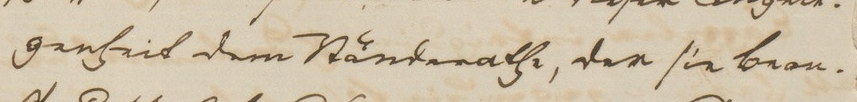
genheit dem Ständerathe, der sie bean-
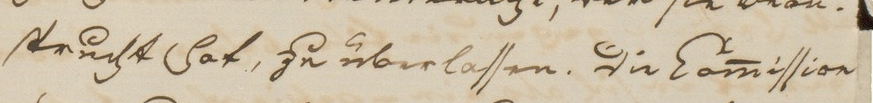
sprucht hat, zu überlassen. Die Commission
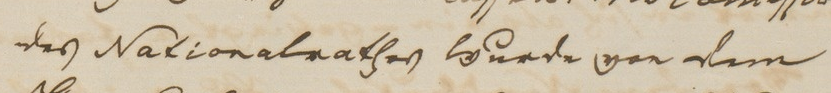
des Nationalrathes wurde von dem
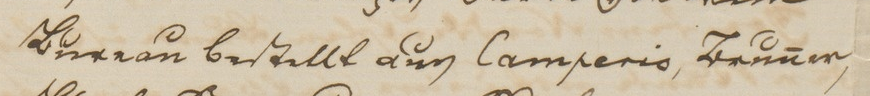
Bureau bestellt aus Camperio, Brunner,
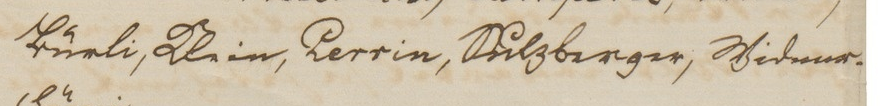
Bürli, Klein, Perrin, Sulzberger, Widmer--
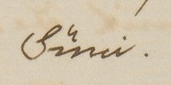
Hüni.
